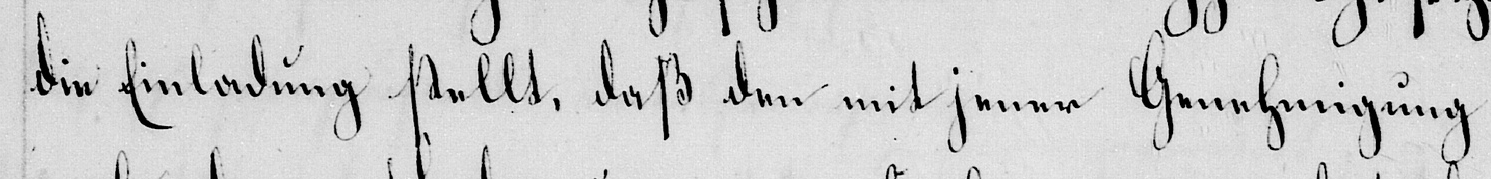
die Einladung stellt, daß den mit jener Genehmigung
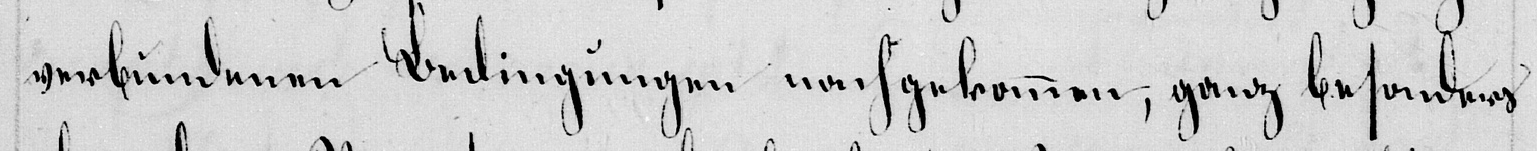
verbundenen Bedingungen nachgekommen, ganz besonders
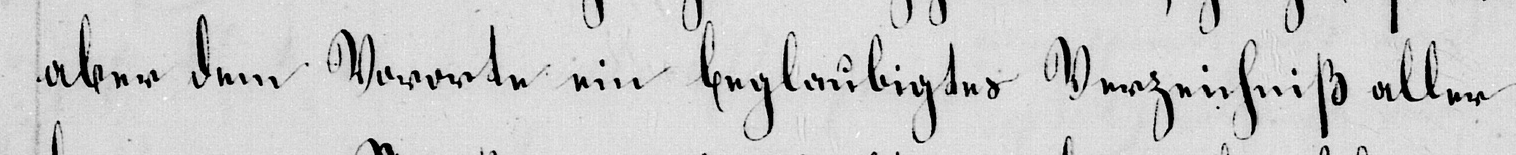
aber dem Vororte ein beglaubigtes Verzeichniß aller
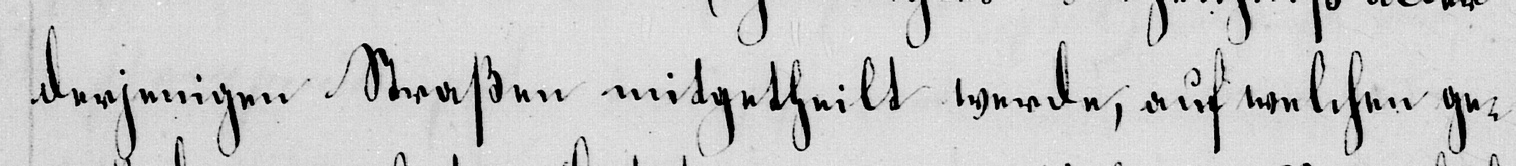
derjenigen Straßen mitgetheilt werde, auf welchen ge¬
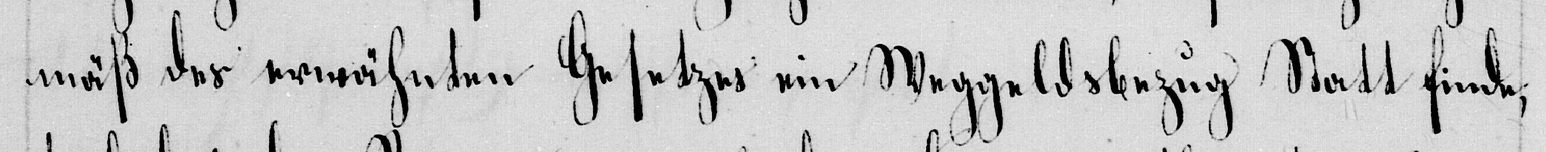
mäß des erwähnten Gesetzes ein Weggeldsbezug Statt finde,
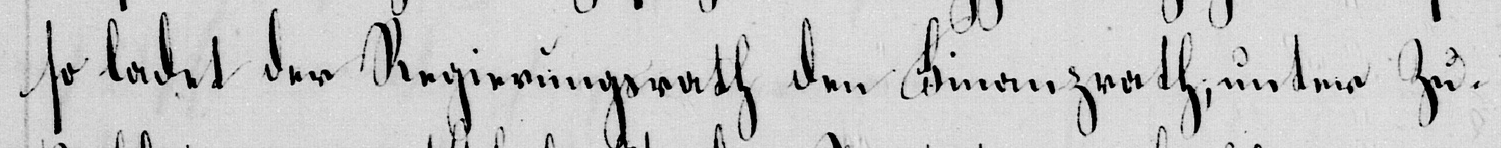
so ladet der Regierungsrath den Finanzrath, unter Zu¬
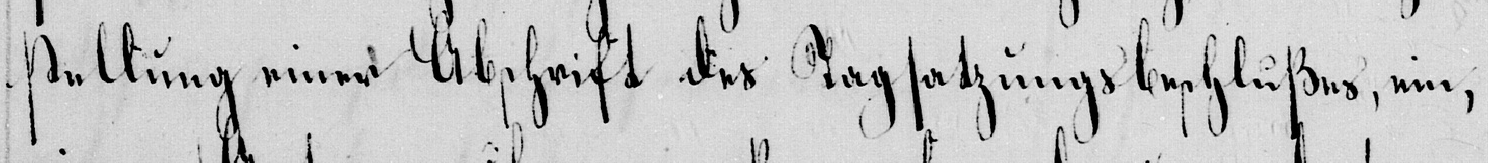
stellung einer Abschrift des Tagsatzungsbeschlußes, ein,
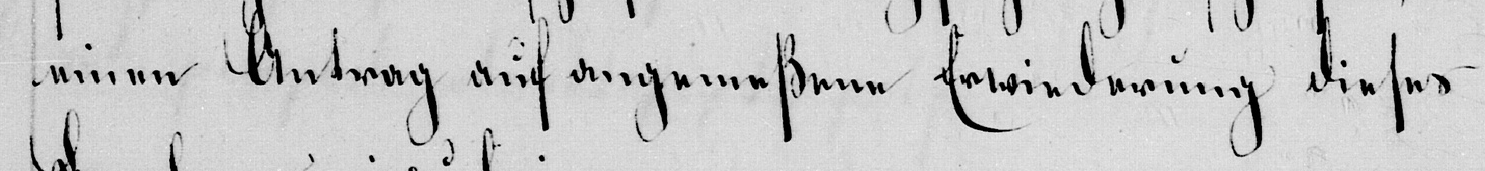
einen Antrag auf angemeßene Erwiederung dieses
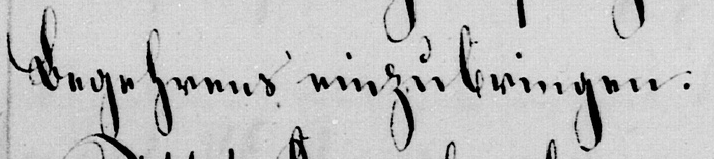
Begehrens einzubringen.
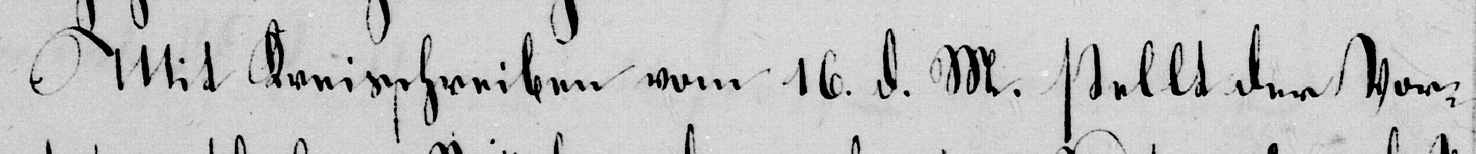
Mit Kreisschreiben vom 16. d. M. stellt der Vor¬
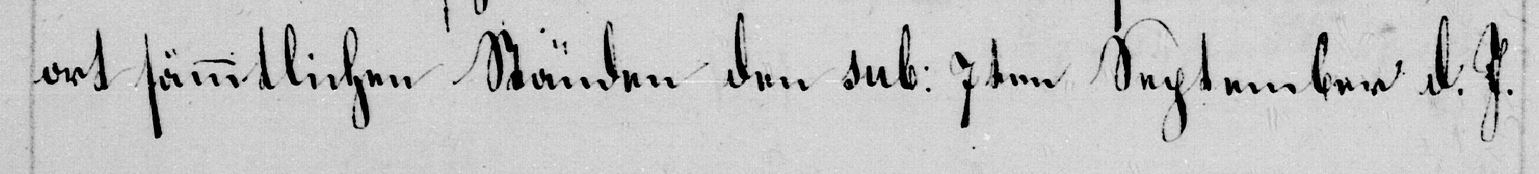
ort sämmtlichen Ständen den sub: 7ten September d. J.
